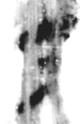壬
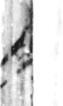丑
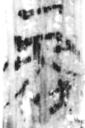丙
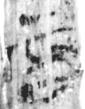晨
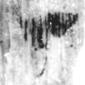丁
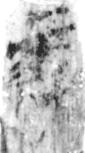亥
